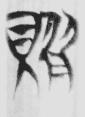{貝并}
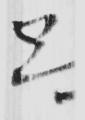巳
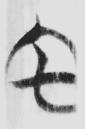宅
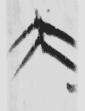大
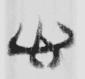心
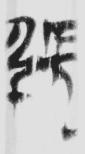張
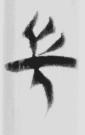𡵂
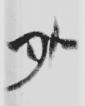外
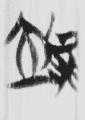{立能}
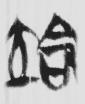{立命}
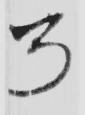乃
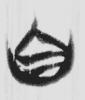自
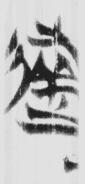{辶止㚔}
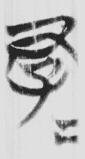尹子=
